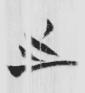之
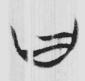曰
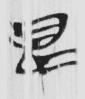鳥
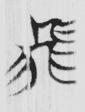飛
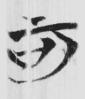可
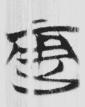{辛用止}
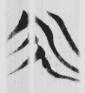永
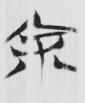余
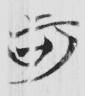可
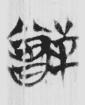矰
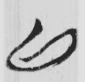㠯（以）
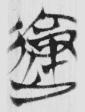{辶𫢁}
